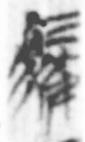○（服）
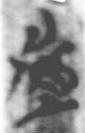益
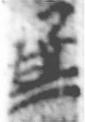爲
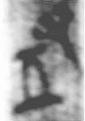○（右）
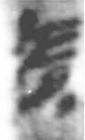驂
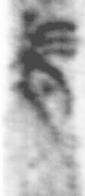長
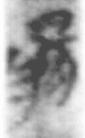腸
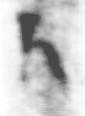人
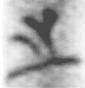之
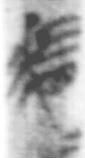駟
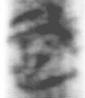政
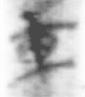車
